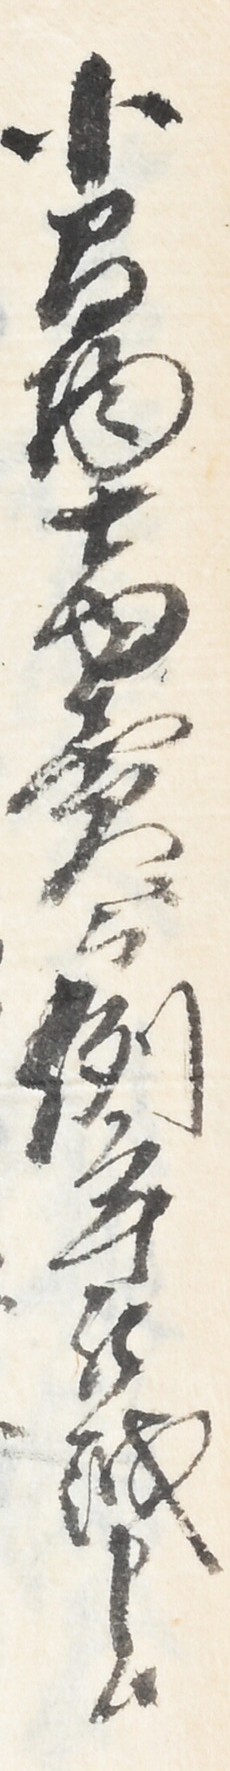小間物商売ニ而例年罷越申候
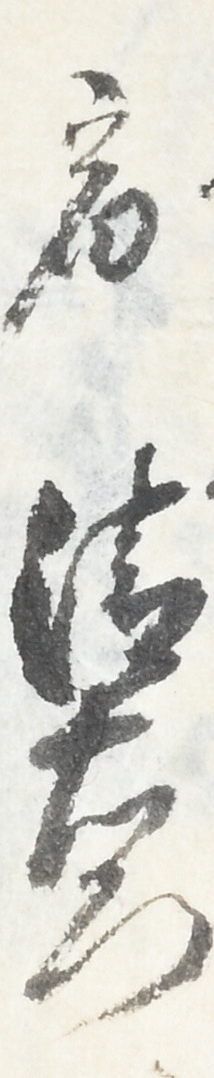宿金右衛門
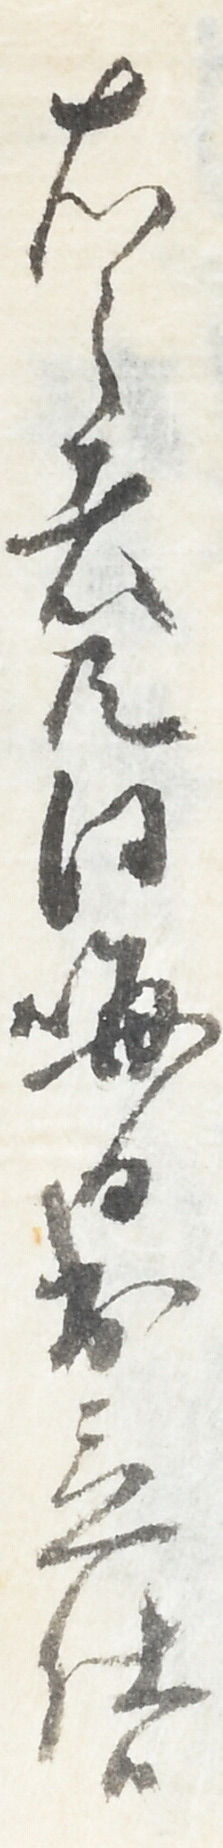右之者共同廿九日出立仕候

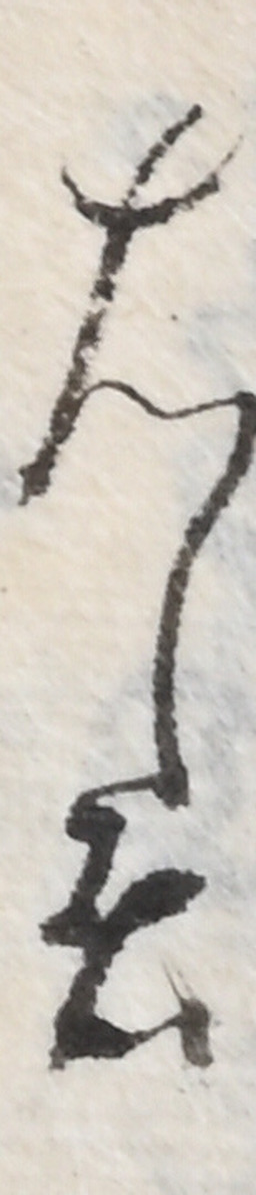右之者
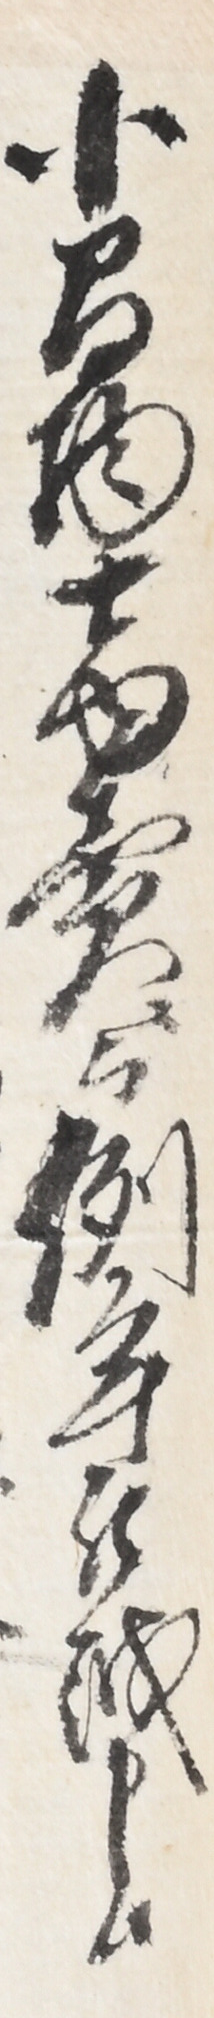小間物商売ニ而例年罷越申候
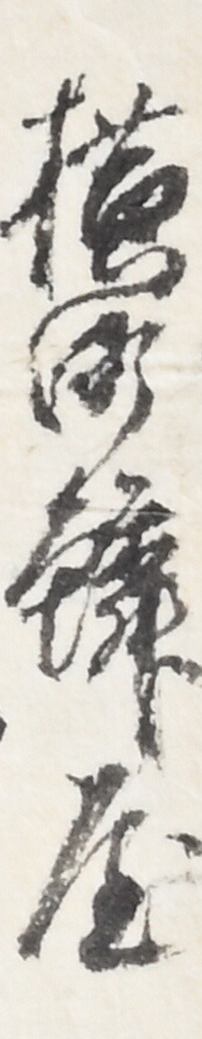横町鱗屋
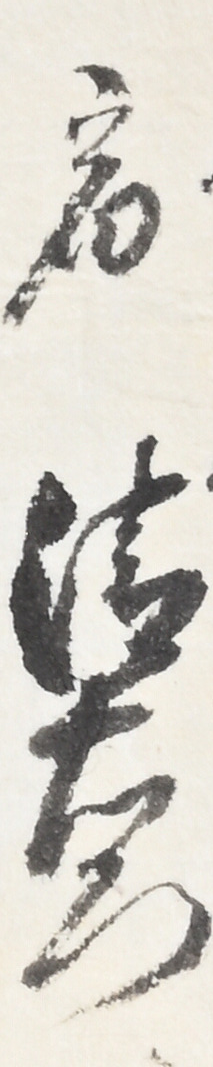宿清右衛門
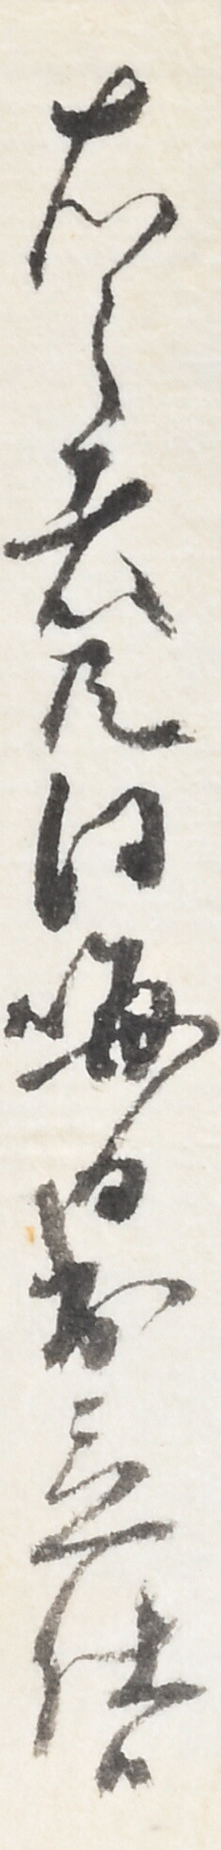右之者共同晦日出立仕候
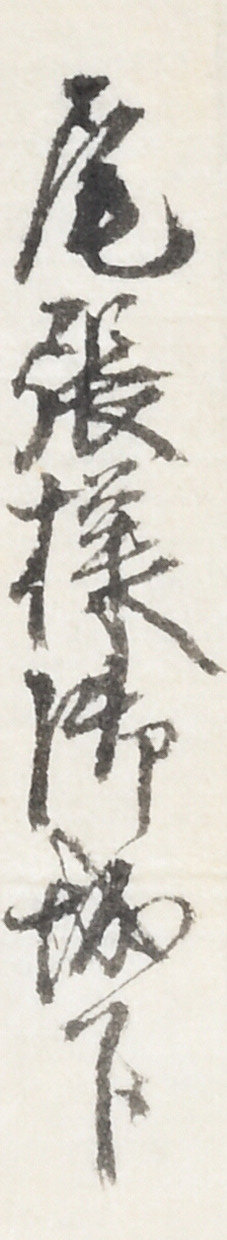尾張様御城下
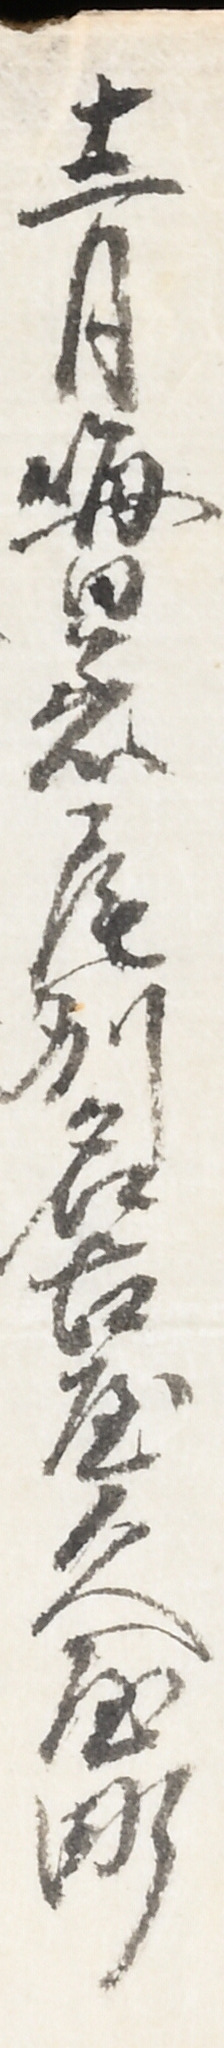十二月晦日着尾州名古屋久屋町
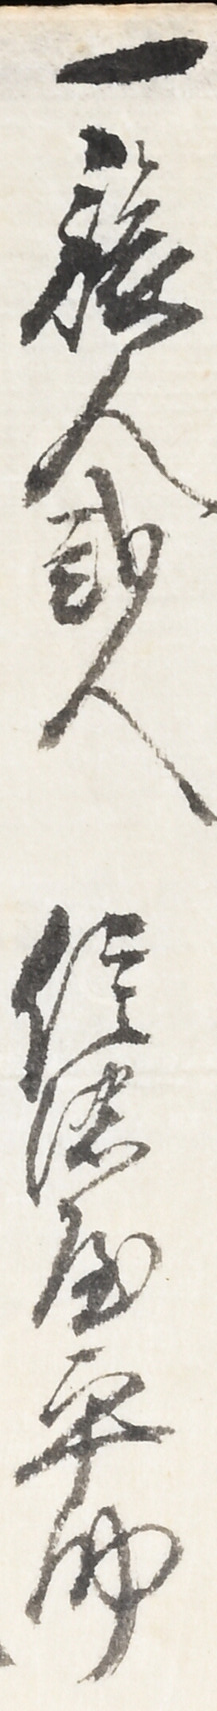一旅人弐人信濃屋平助
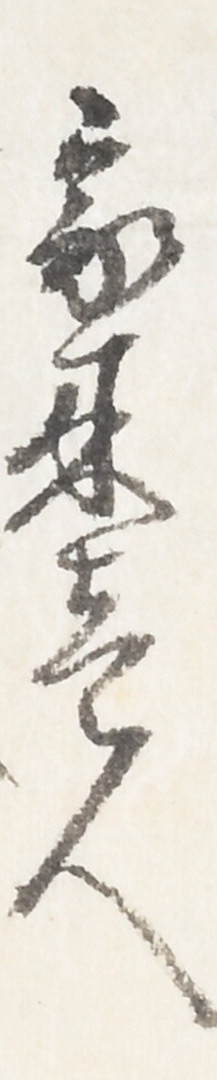家来壱人
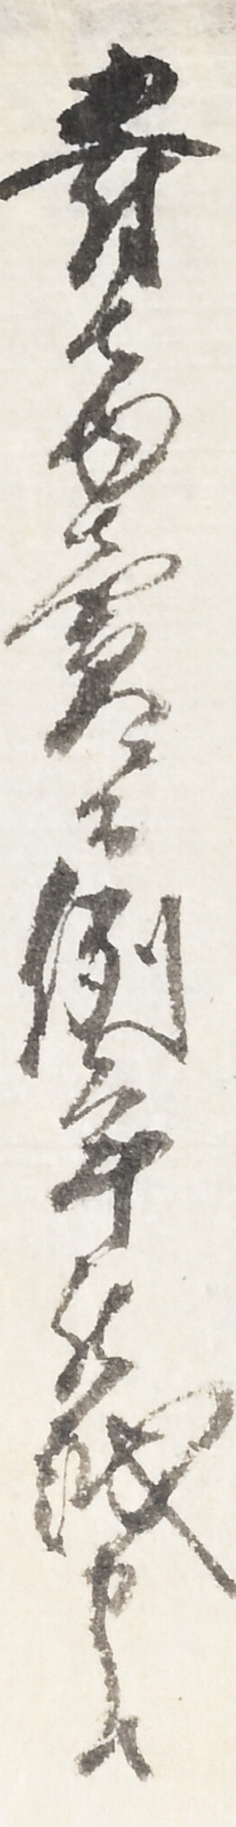肴商売ニ而例年罷越申候
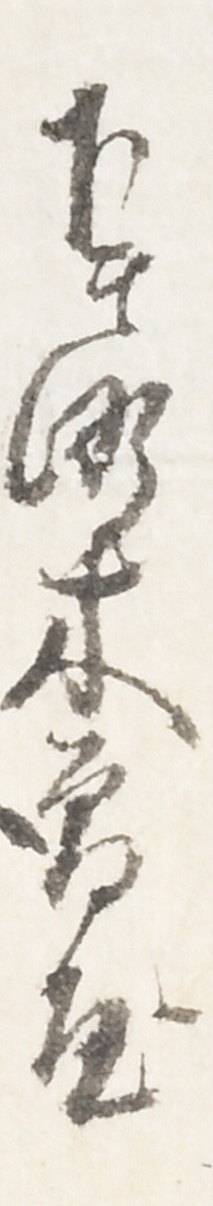下モ町木曽屋
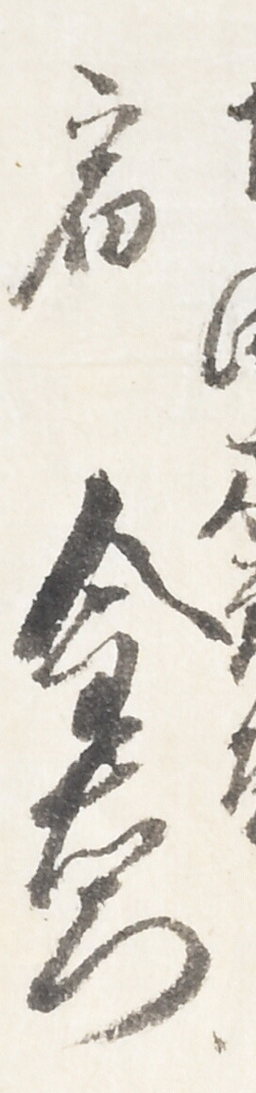宿金右衛門
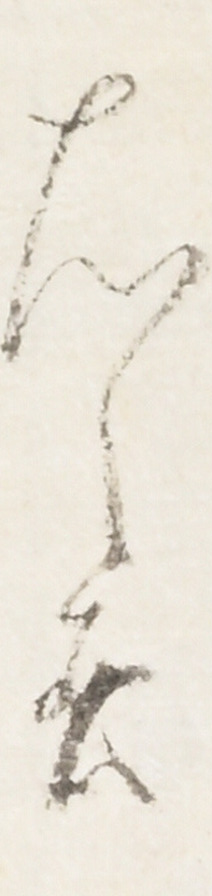右之者
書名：旅人泊控帳
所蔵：伊那市立高遠町図書館・合同会社AMANE
